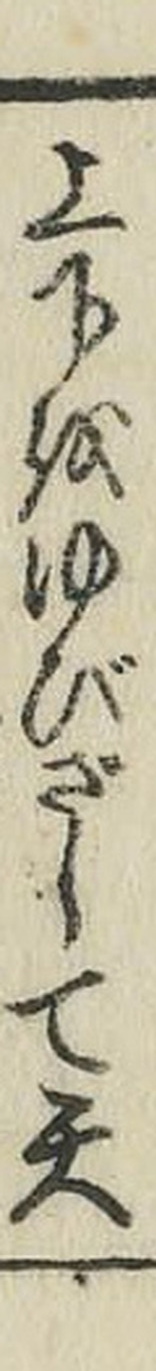上下をゆびざして天
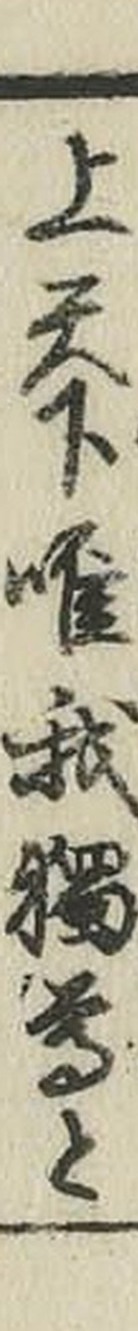上天下唯我独尊と
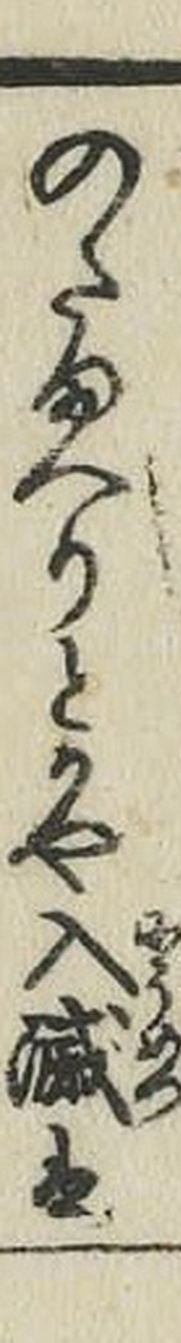のたまへりとかや入滅は
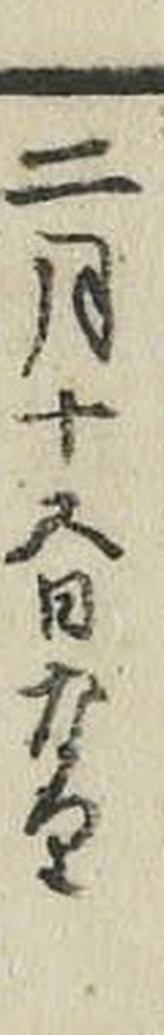二月十五日なり

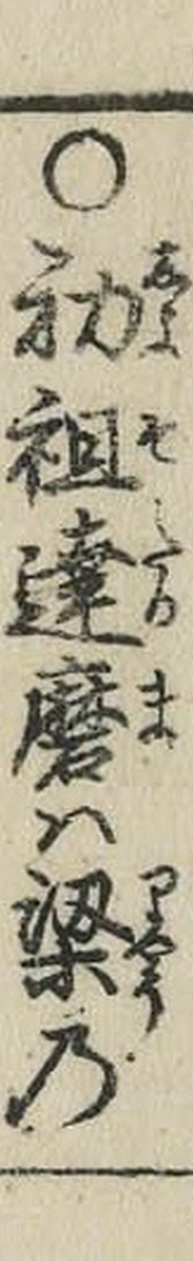○初祖達磨は梁の
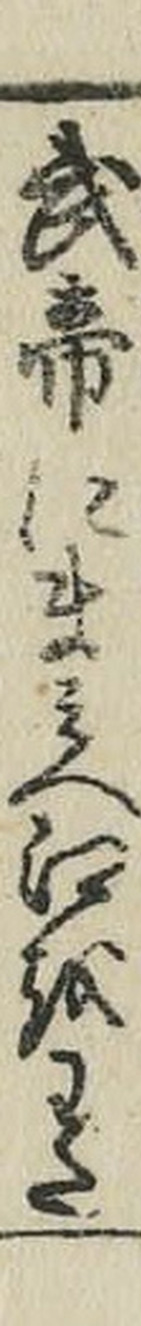武帝にまみへ江をわた
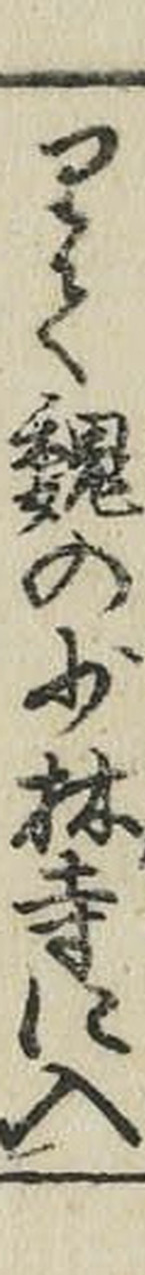りて魏の少林寺に入
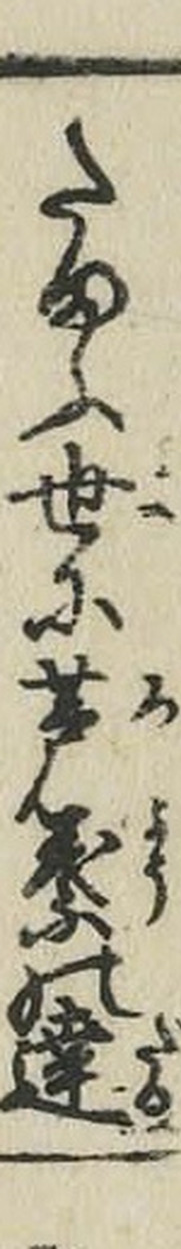たまふ世に芦葉の達
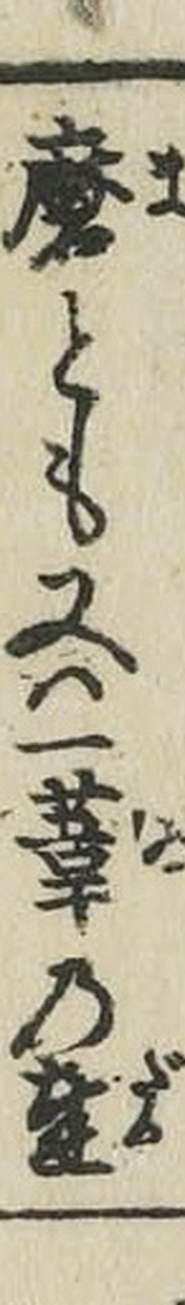磨とも又は一葦の達
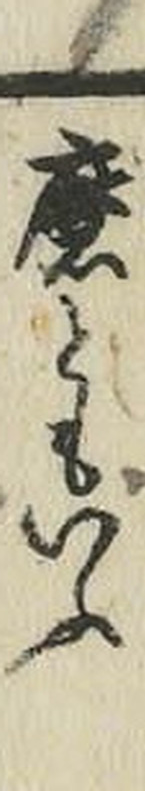磨ともいふ
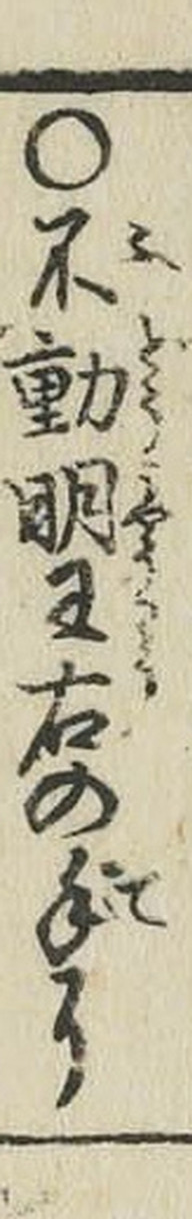○不動明王右の手に
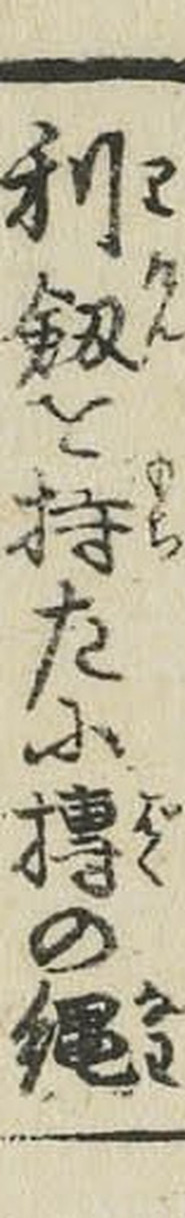利剣を持左に搏の縄
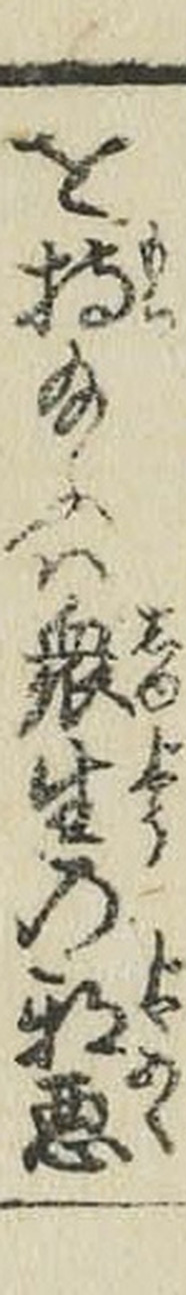を持給ふは衆生の邪悪
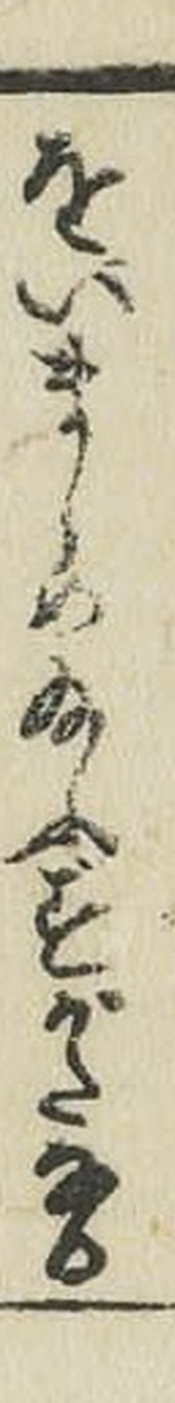をいましめ給ふすがたなる
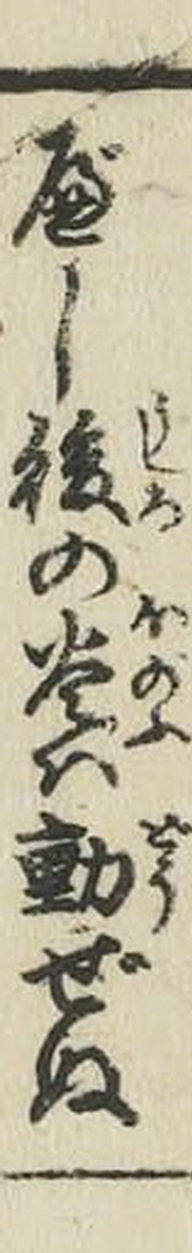べし後の炎は動ぜぬ
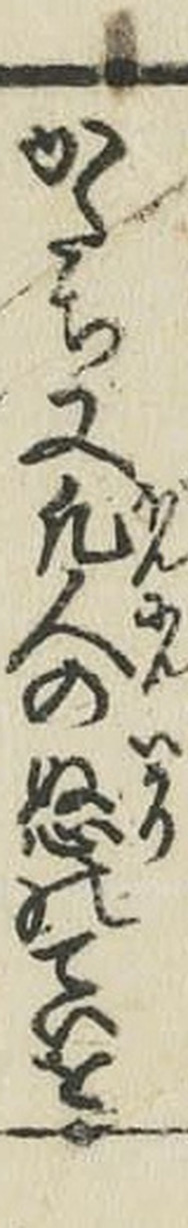かたち又凡人の怒のていを
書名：増補頭書訓蒙図彙大成 10巻 10:巻之21
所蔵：東京学芸大学教育コンテンツアーカイブ
